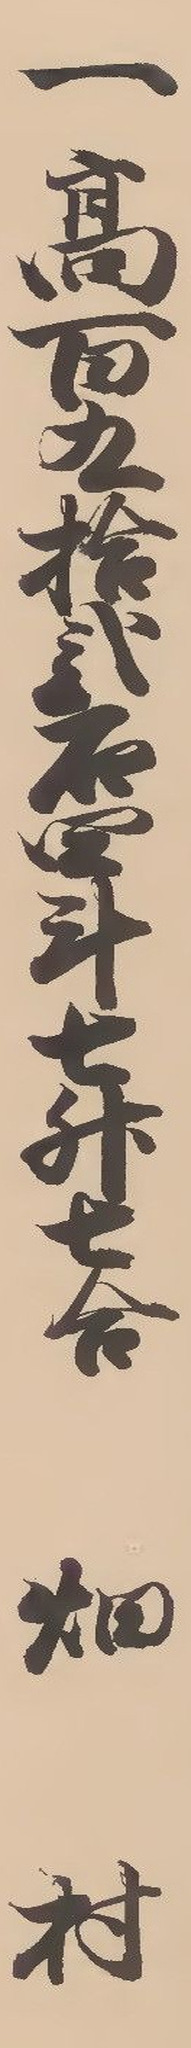一高百九拾弐石四斗七升七合畑村
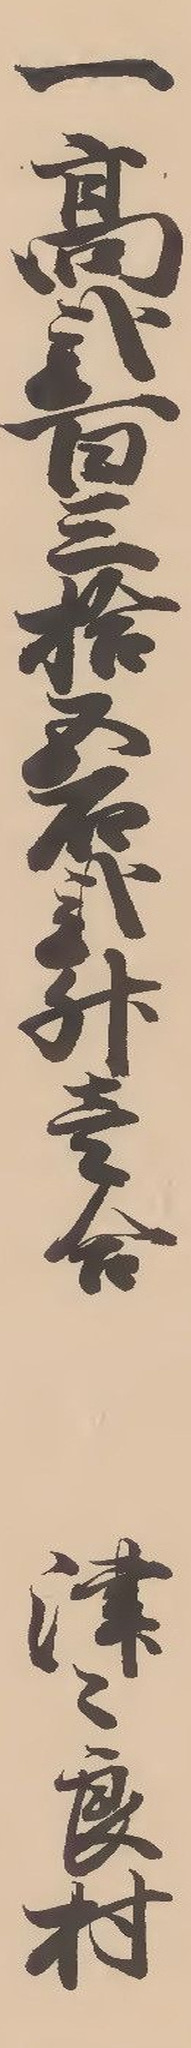一高弐百三拾五石弐升壱合津々良村
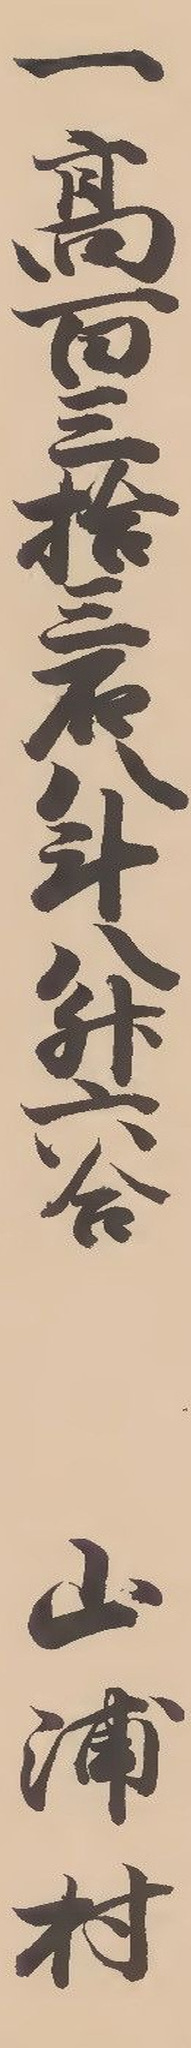一高百三拾三石八斗八升六合山浦村
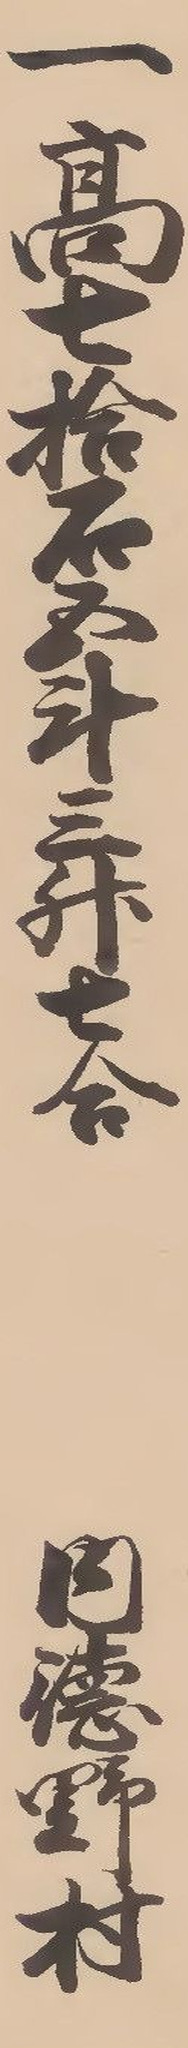一高七拾石五斗三升七合内徳野村

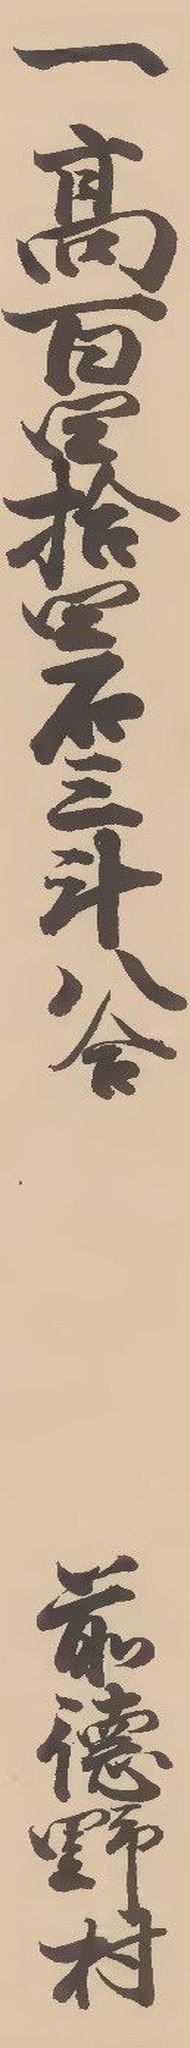一高百四拾四石三斗八合前徳野村
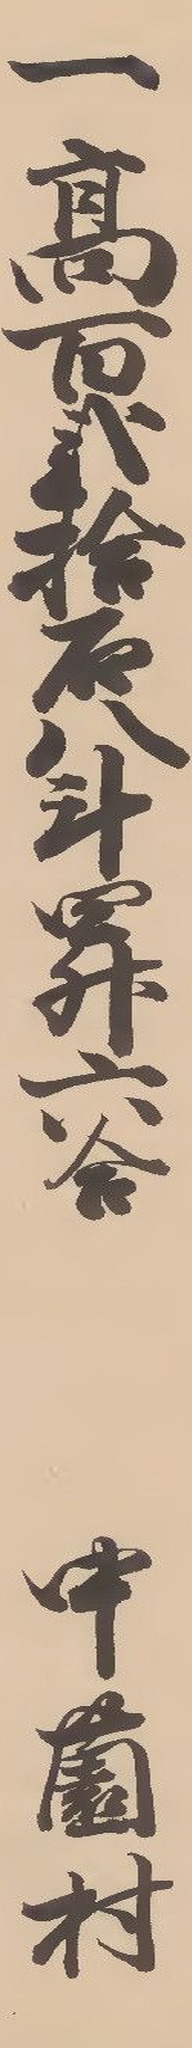一高百弐拾石八斗四升六合中園村
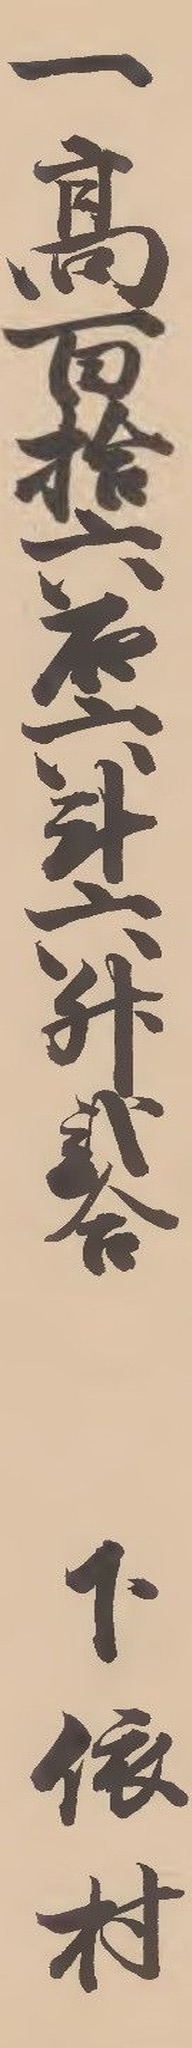一高百拾六石六斗六升弐合下依村
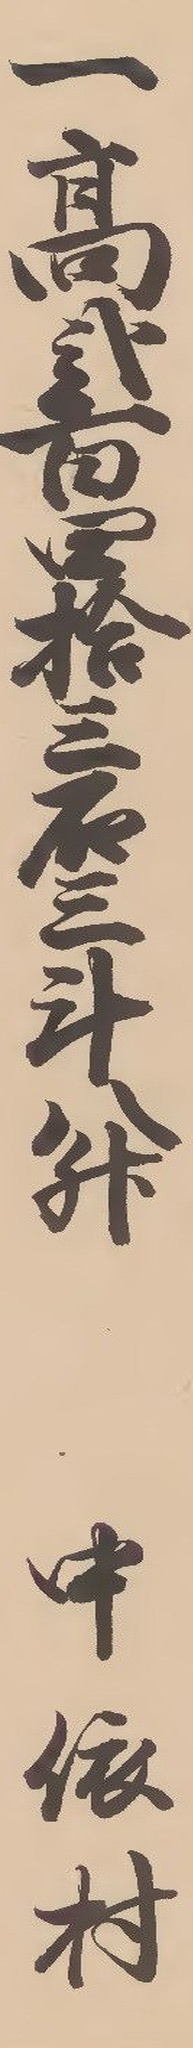一高弐百四拾三石三斗八升中依村
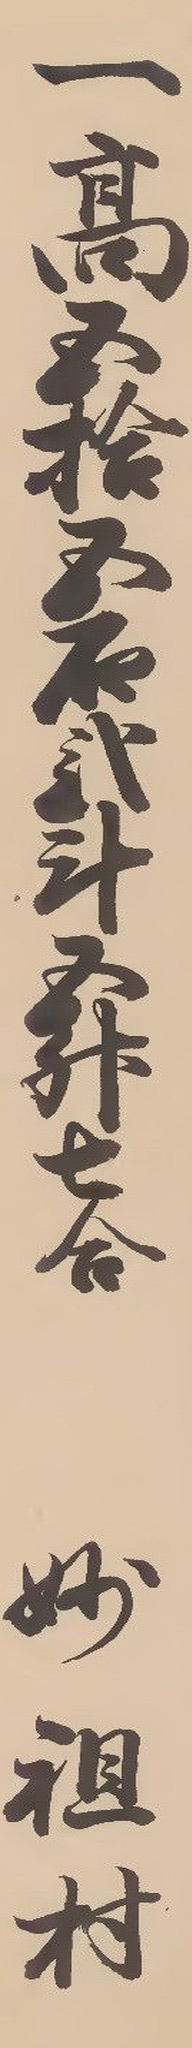一高五拾五石弐斗五升七合妙祖村
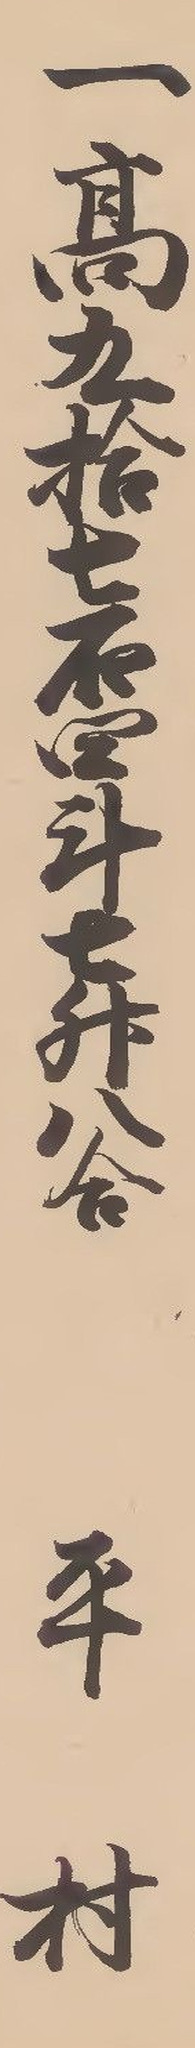一高九拾七石四斗七升八合平村
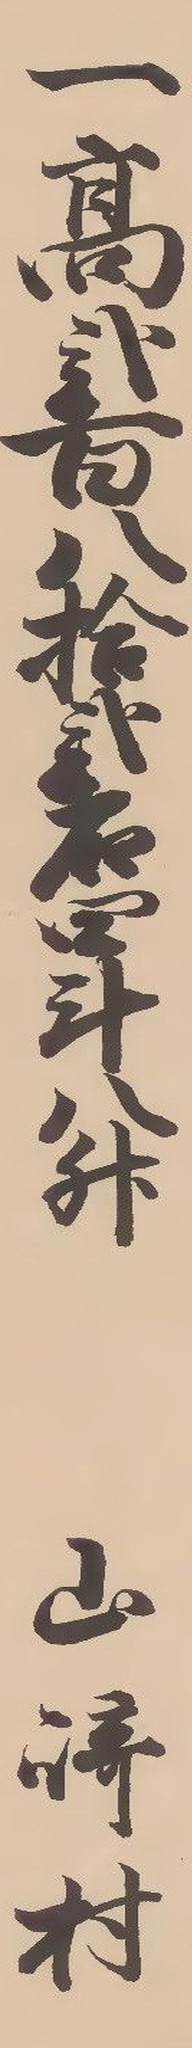一高弐百八拾弐石四斗八升山崎村
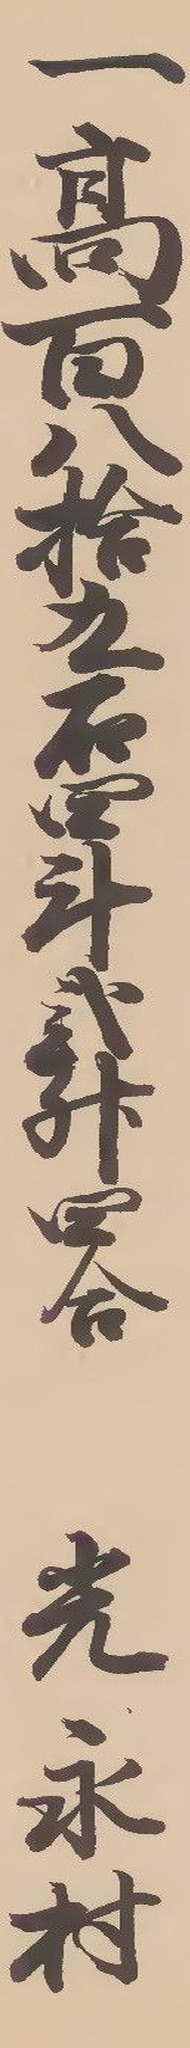一高百八拾九石四斗弐升四合光永村

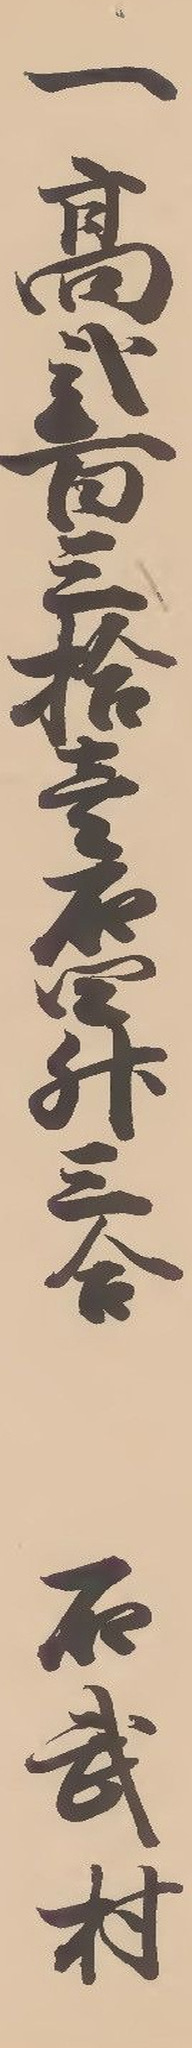一高弐百三拾壱石四升三合石武村
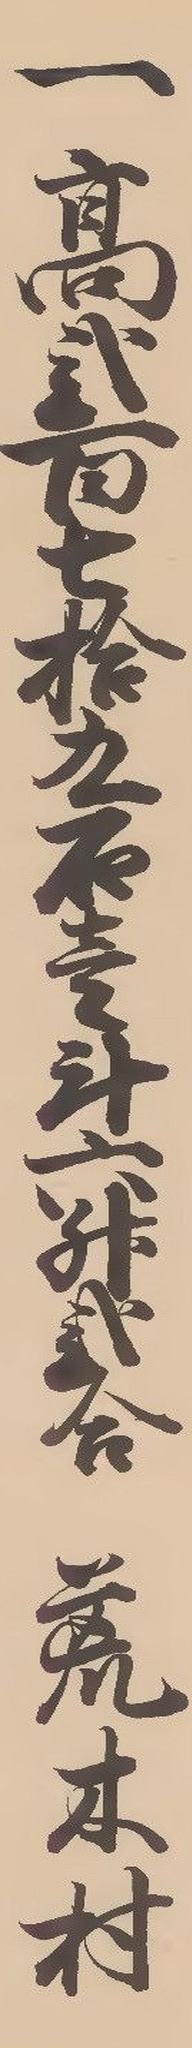一高弐百七拾九石壱斗六升弐合荒木村
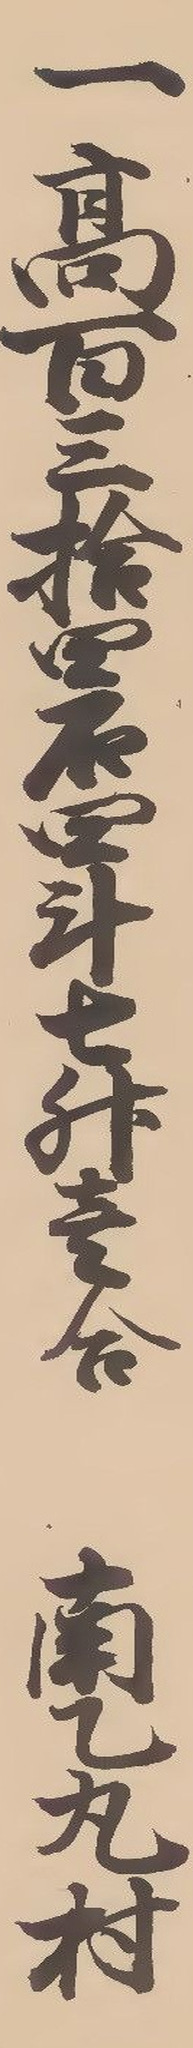一高百三拾四石四斗七升壱合南乙丸村
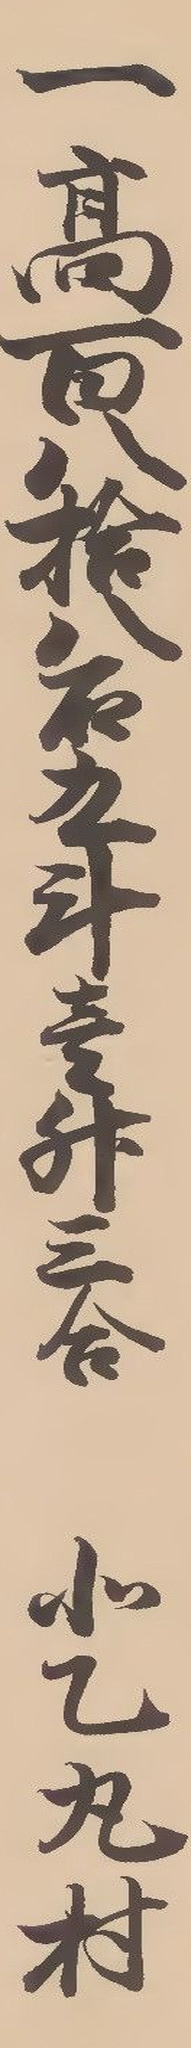一高百八拾八石九斗壱升三合北乙丸村
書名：豊後国郷帳
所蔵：国立公文書館 National Archives of Japan
